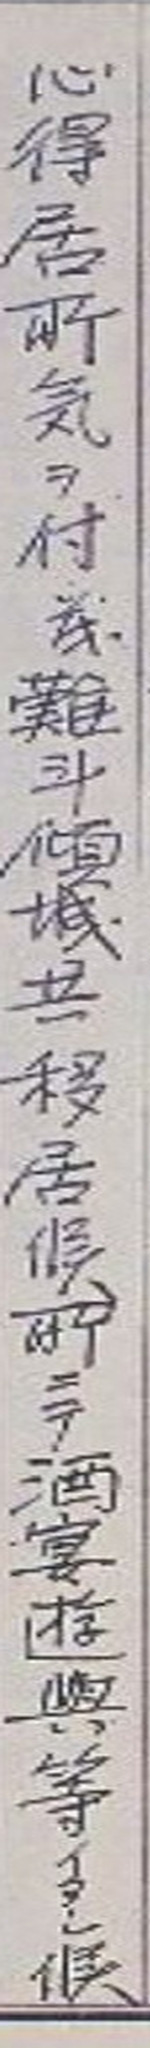心得居所気を付も難計傾城共移居候所にて酒宴遊興等いたし候
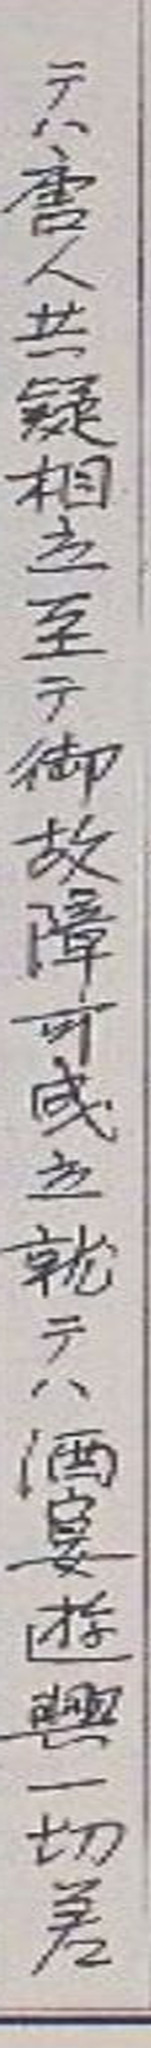ては唐人共疑相立至て御故障可成立就ては酒宴遊興一切差
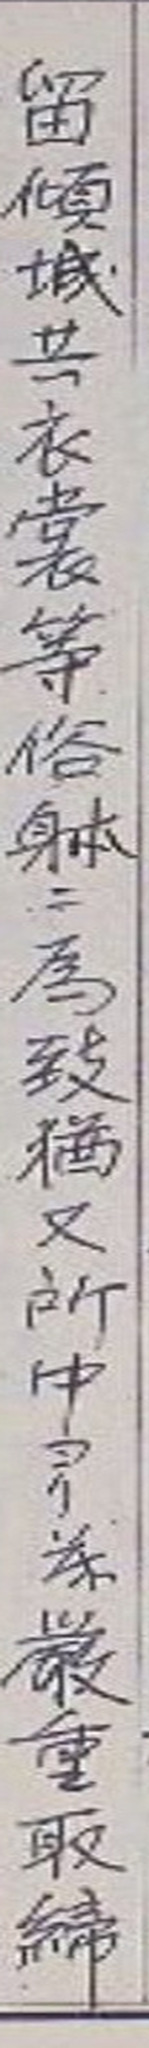留傾城共衣裳等俗躰に為致猶又所中よりも厳重取締
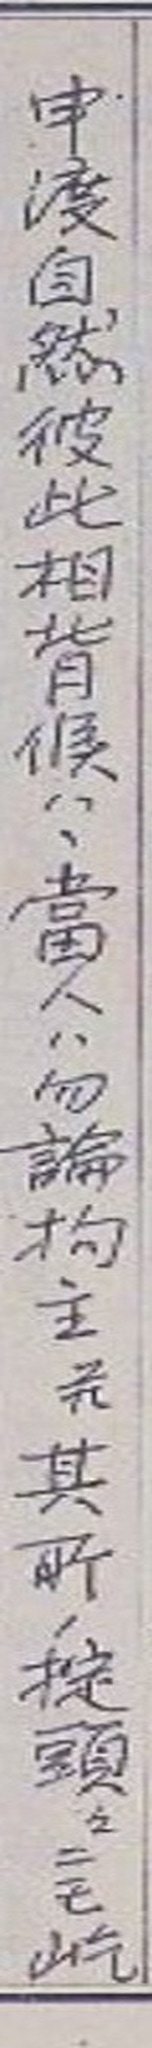申渡自然彼此相背候はゝ当人は勿論拘主并其所の掟頭々にも屹
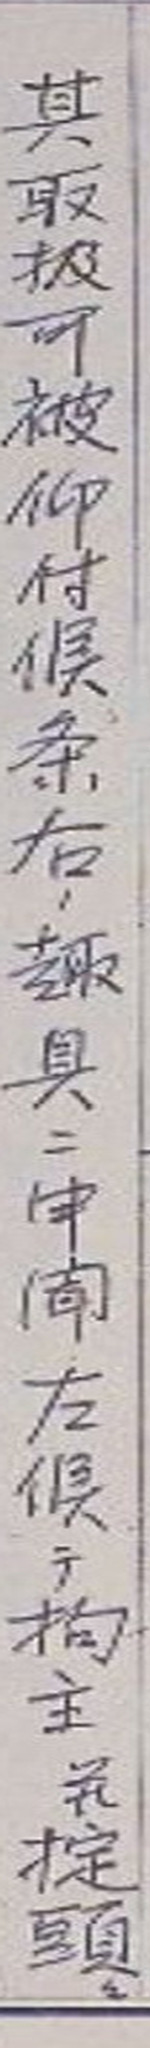其取扱可被仰付候条右の趣具に申聞左候て拘主并掟頭々
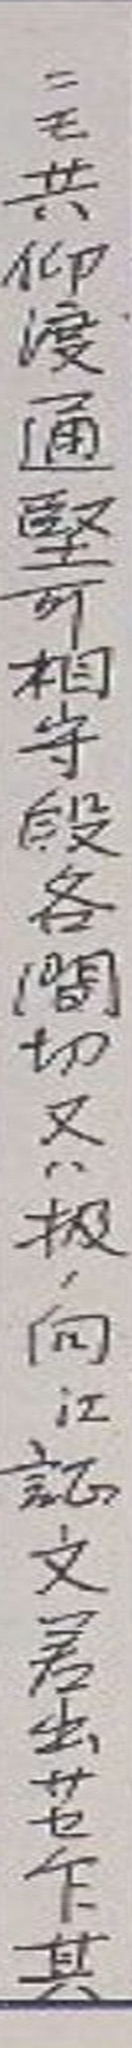にも共仰渡通堅可相守段各間切又は扱の向え証文差出させ乍其
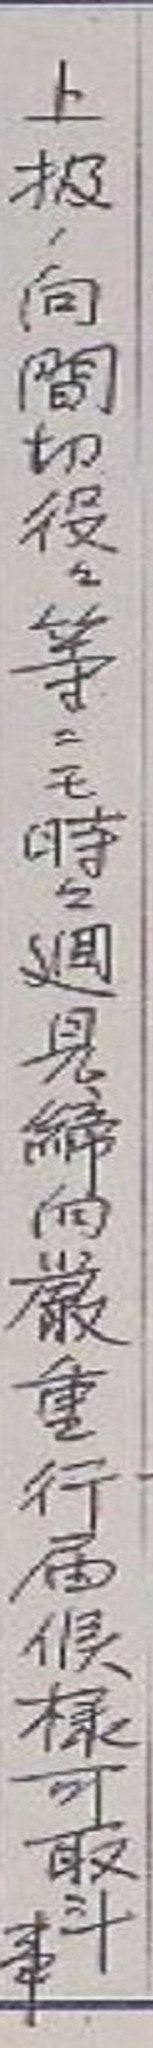上扱の向間切役々等にも時々廻見締向厳重行届候様可取計事

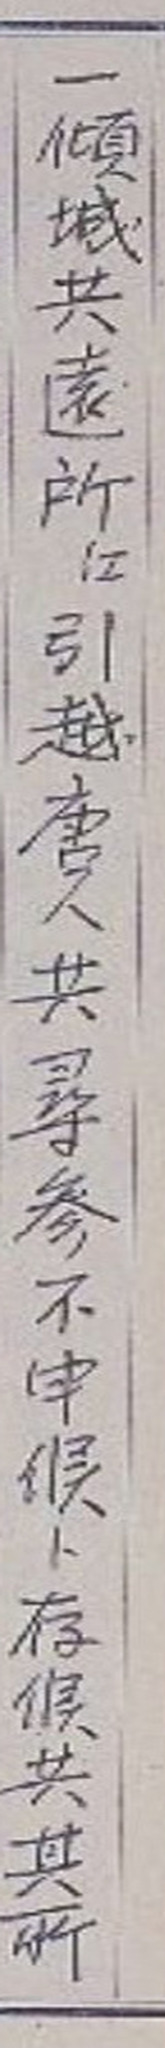一傾城共遠所え引越唐人共尋参不申候と存候共其所
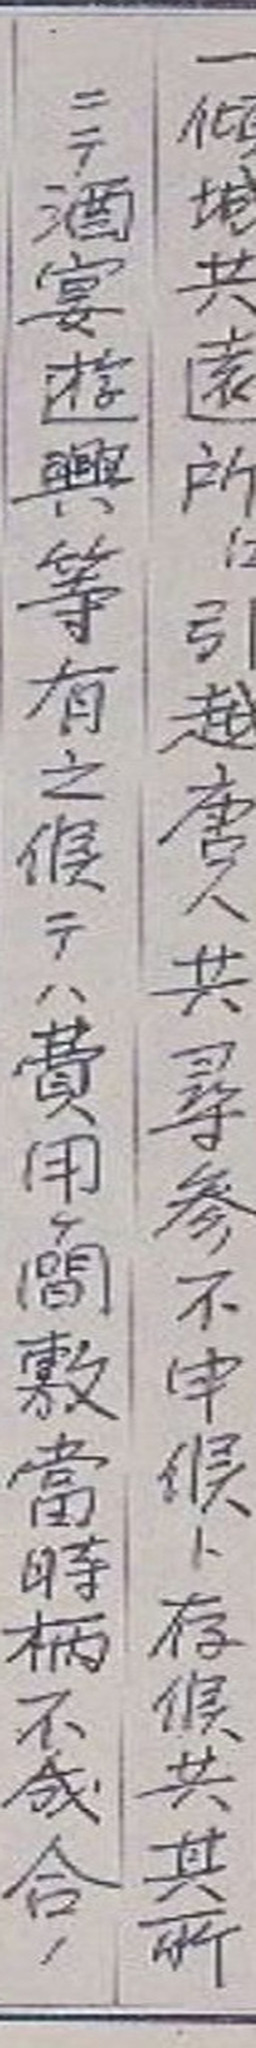にて酒宴遊興等有之候ては費用ケ間敷当時柄不成合の
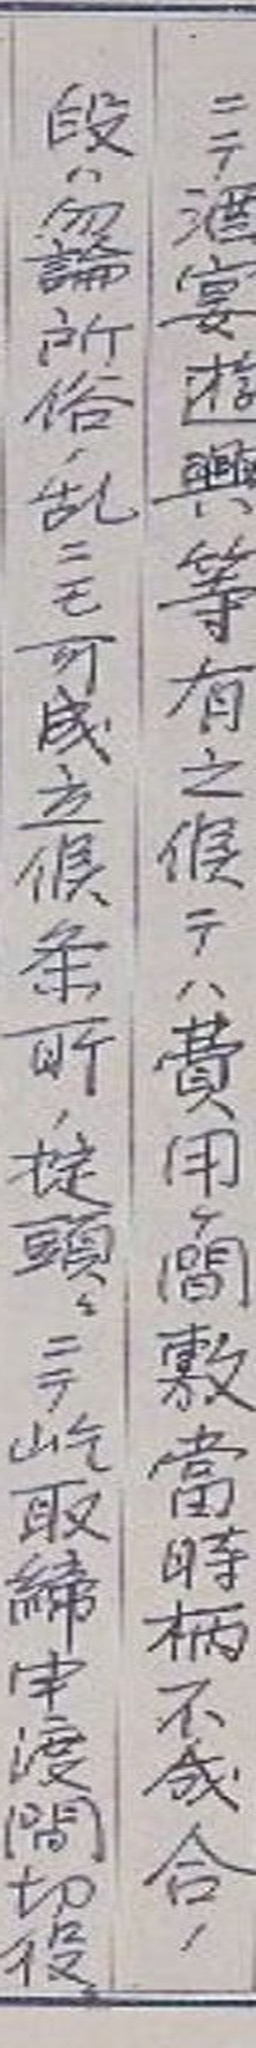段は勿論所俗の乱にも可成立候条所の掟頭々にて屹取締申渡間切役
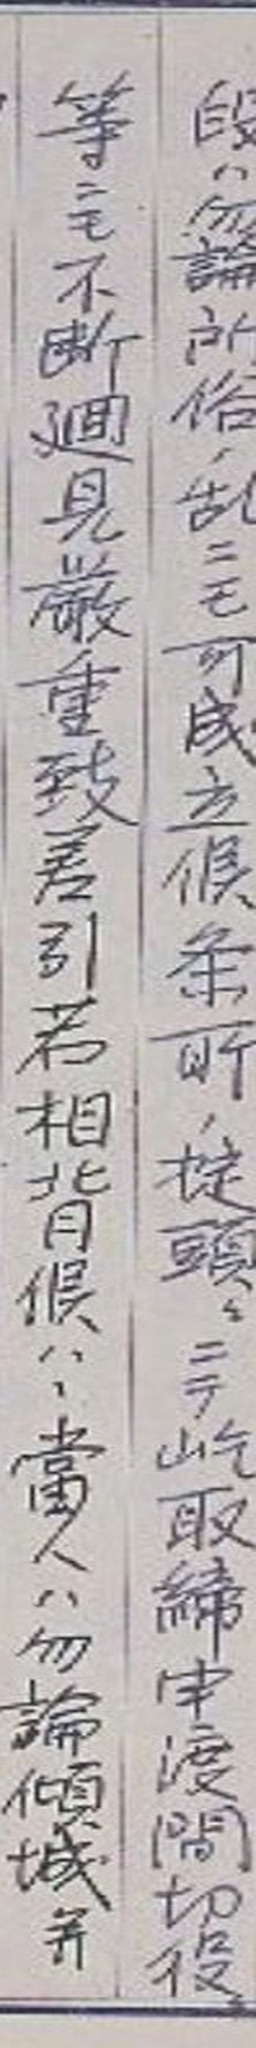等にも不断廻見厳重致差引若相背候はゝ当人は勿論傾城并
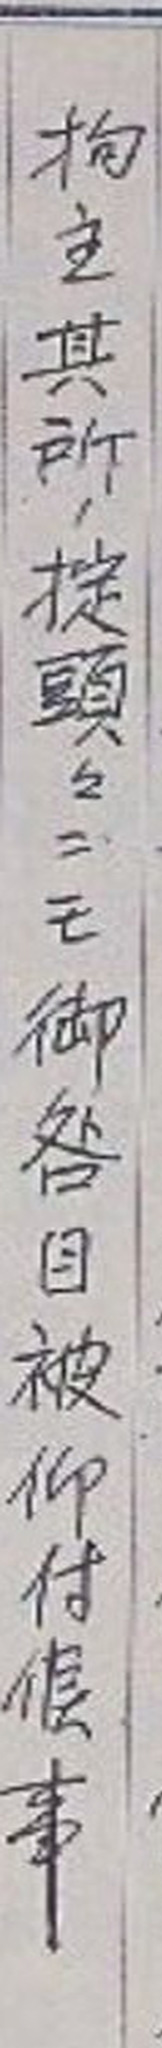拘主其所の掟頭々にも御咎被仰付候事
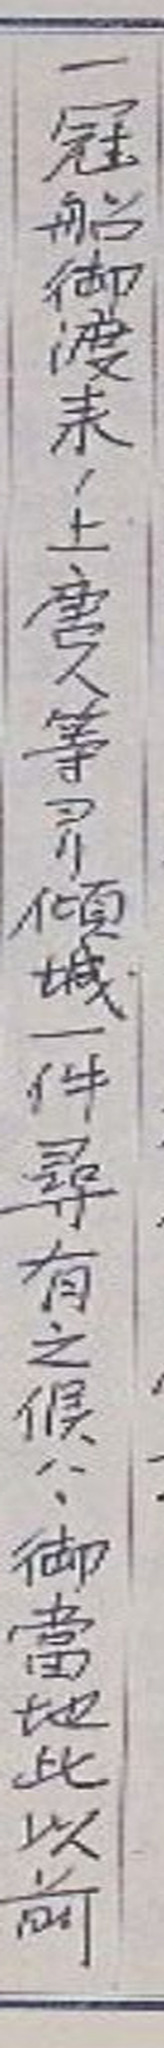一冠船御渡来の上唐人等より傾城一件尋有之候はゝ御当地此以前
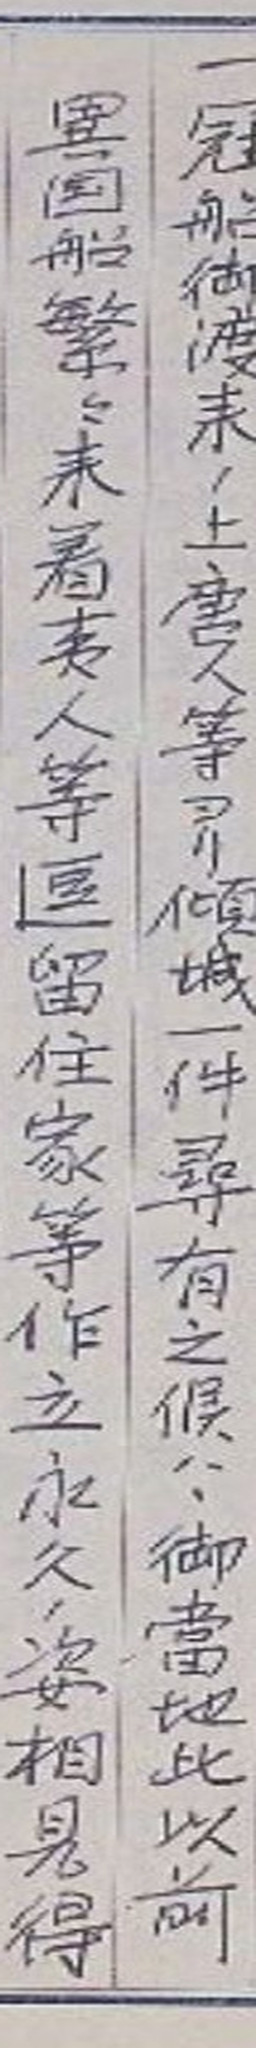異国船繁々来着夷人等逗留住家等作立永久の姿相見得
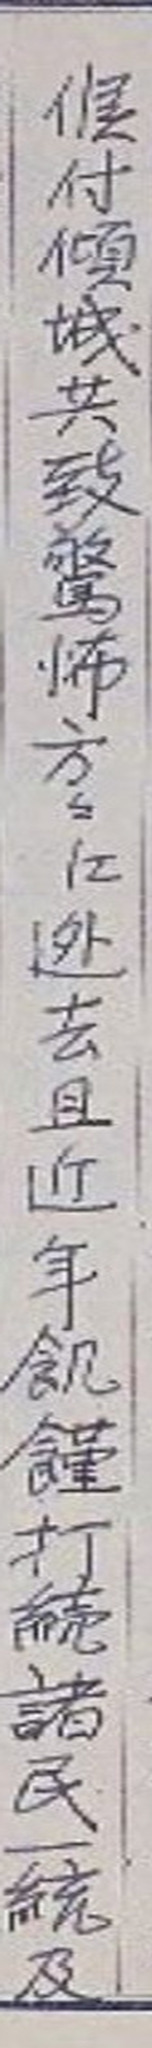候付傾城共致恐怖方々え逃去且近年飢饉打続諸民一統及
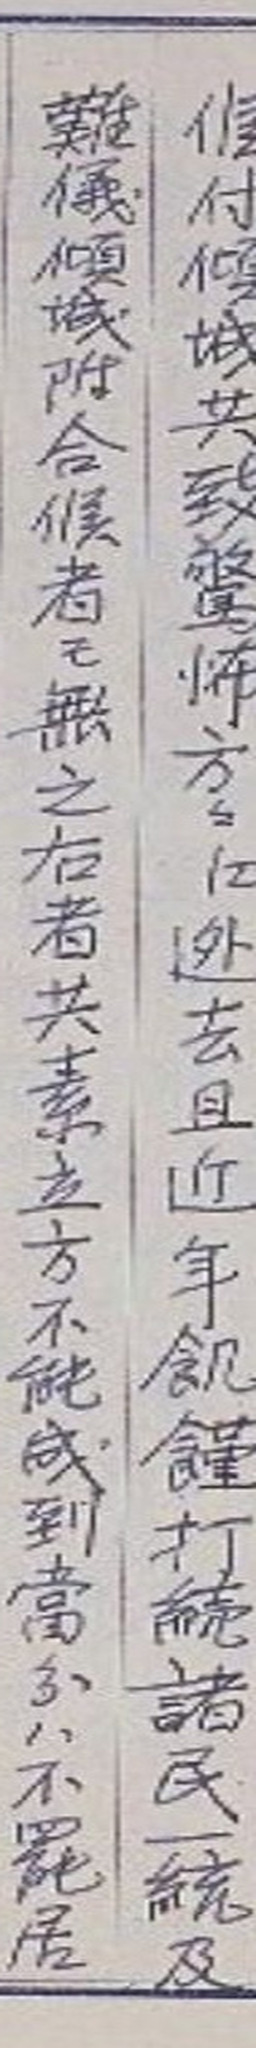難儀傾城附合候者も無之右者共素立方不能成到当分は不罷居
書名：支那冊封使来琉諸記 下巻
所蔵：University of the Ryukyus Library
